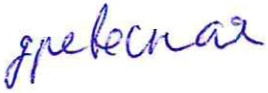древесная
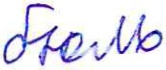бюль
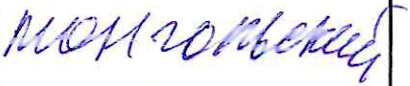монгольский
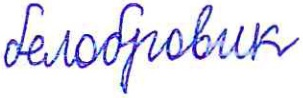белобровик
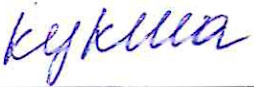кукша
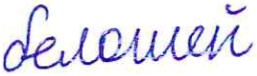белошей
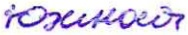южная
